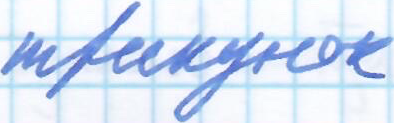трескунок
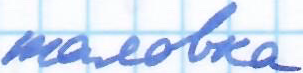таловка
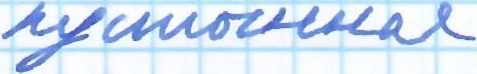пустынная
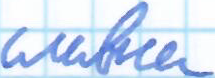славка
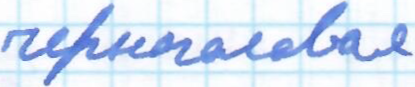черноголовая
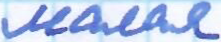малая
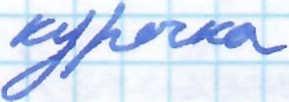курочка
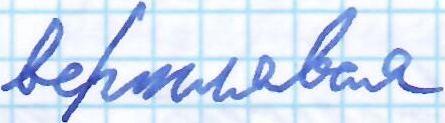вертлявая
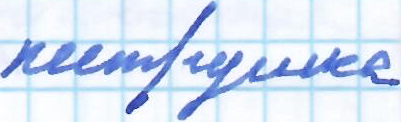пеструшка
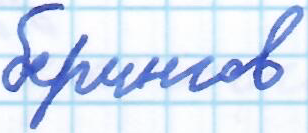берингов
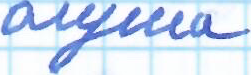олуша
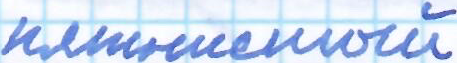пятнистый
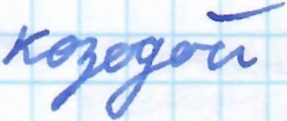козодой
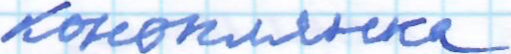коноплянка
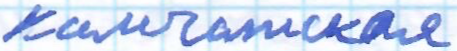камчатская
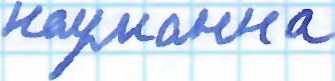науманна
